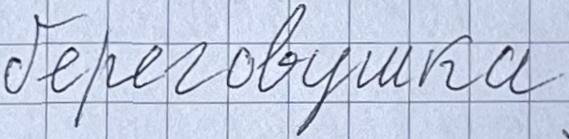береговушка
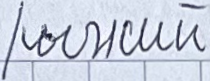рыжий
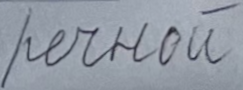речной
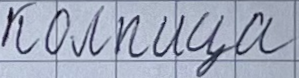колпица
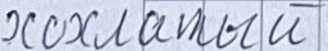хохлатый
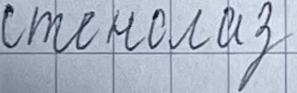стенолаз
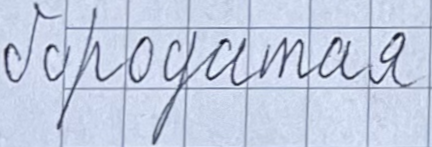бородатая
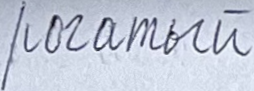рогатый
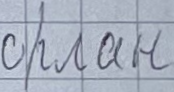орлан
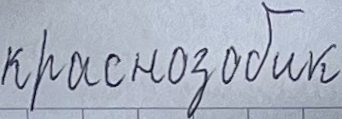краснозобик
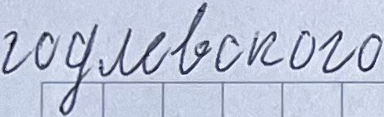годлевского
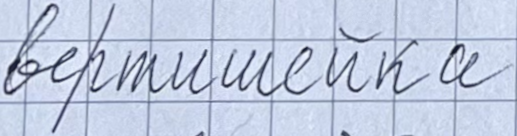вертишейка
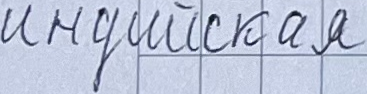индийская
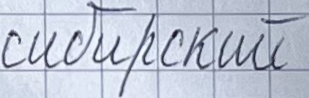сибирский
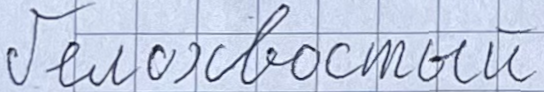белохвостый
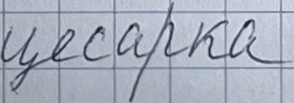цесарка
